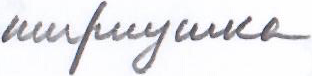тиркушка
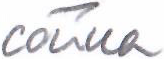сойка
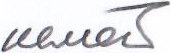немой
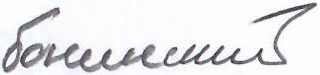бонинский
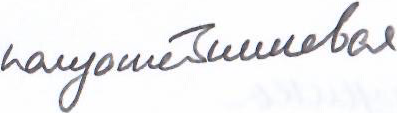полуошейниковая
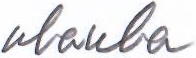кваква
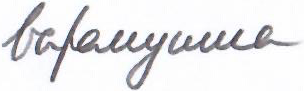варакушка
